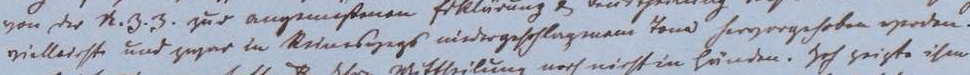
vielleicht und zwar in keineswegs niedergeschlagenem Tone hervorgehoben werden.
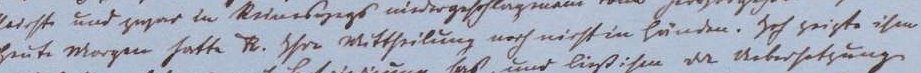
Heute Morgen hatte R. Ihre Mittheilung noch nicht in Händen. Ich zeigte ihm
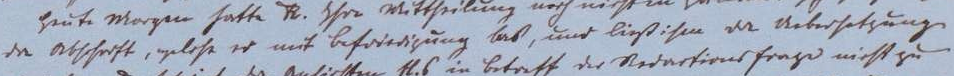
die Abschrift, welche er mit Befriedigung las, und ließ ihm die Uebersetzung
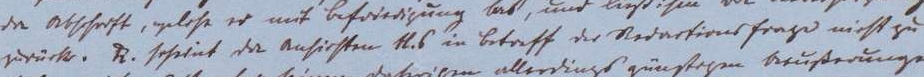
zurück. R. scheint der Ansichten H.s in Betreff der Redactionsfrage nicht zu
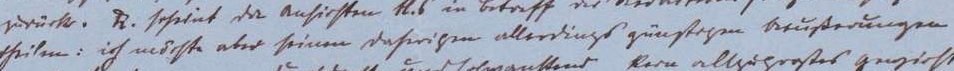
theilen: ich möchte aber seinen daherigen allerdings günstigen Aeußerungen
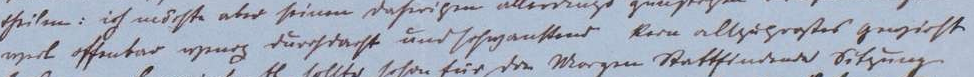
weil offenbar wenig durchdacht und schwankend kein allzugroßes Gewicht
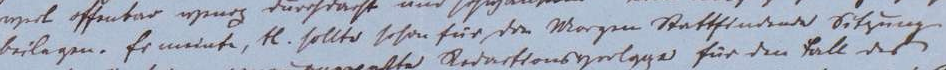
beilegen. Er meinte, H. sollte schon für die Morgen Stattfindende Sitzung
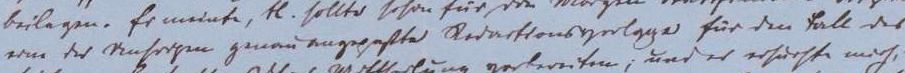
eine der Unserigen genau angepaßte Redactionsvorlage für den Fall des
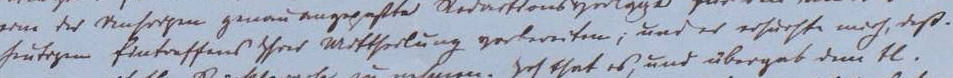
heutigen Eintreffens Ihrer Mittheilung vorbereiten; und er ersuchte mich, deß-
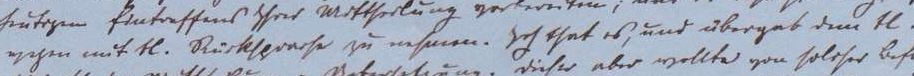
wegen mit H. Rücksprache zu nehmen. Ich that es, und übergab dem H.
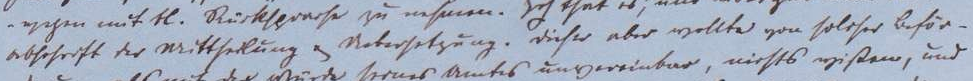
Abschrift der Mittheilung & Uebersetzung. Dieser aber wollte von solcher Beför-
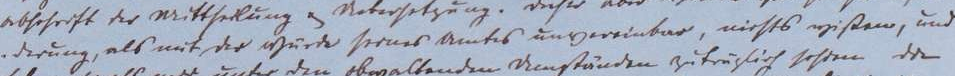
derung, als mit der Würde seines Amtes unvereinbar, nichts wißen, und
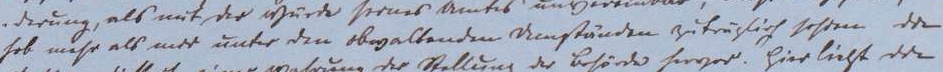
hob mehr als mir unter den obwaltenden Umständen zuträglich schien die
